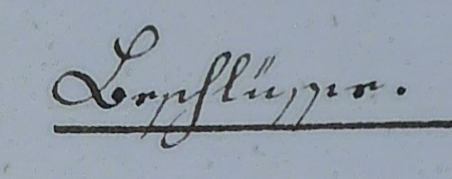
Beschlüsse.
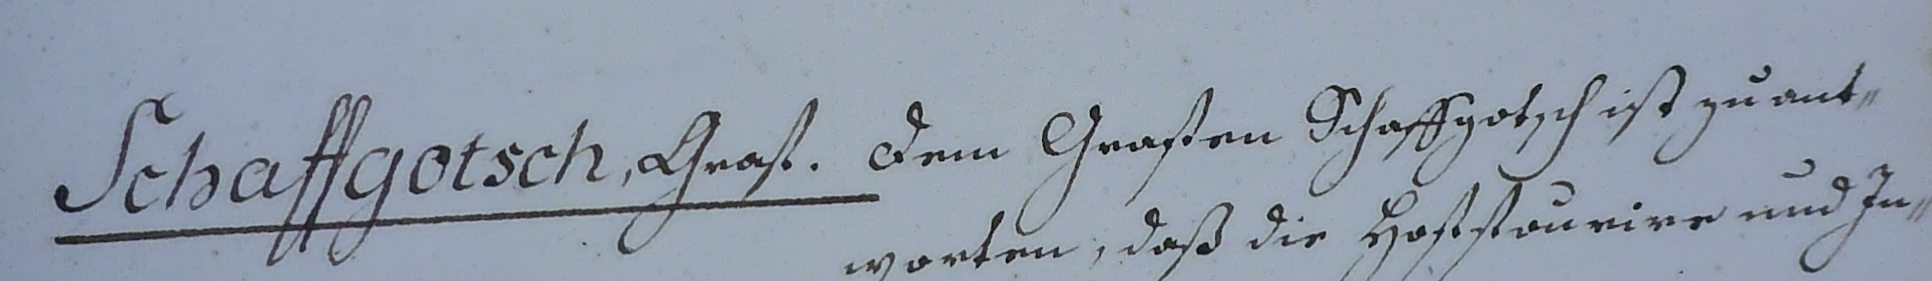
Schaffgotsch, Graf. Dem Grafen Schaffgotsch ist zu ant¬
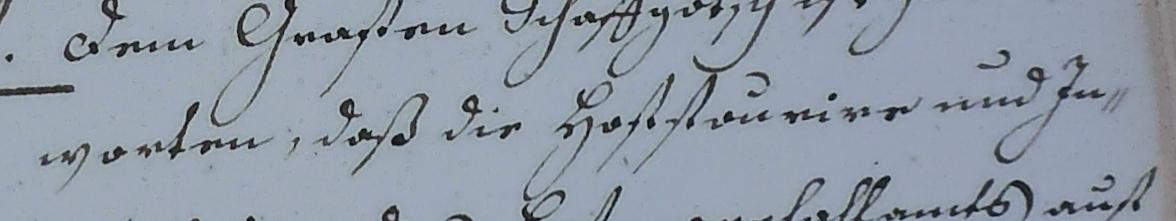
worten, daß die Hoffourire und In¬
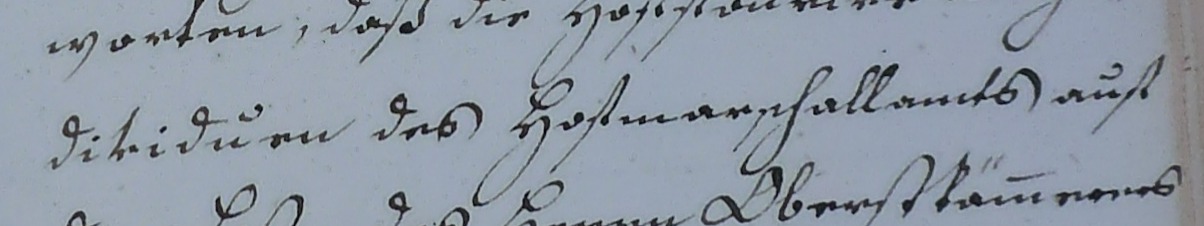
dividuen des Hofmarschallamts auf
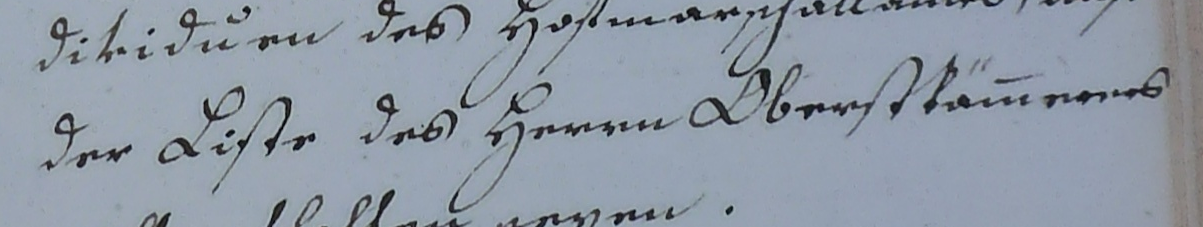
der Liste des Herrn Oberstkäm̅erers
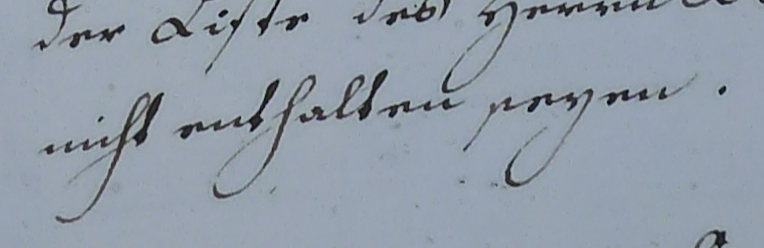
nicht enthalten seyen.
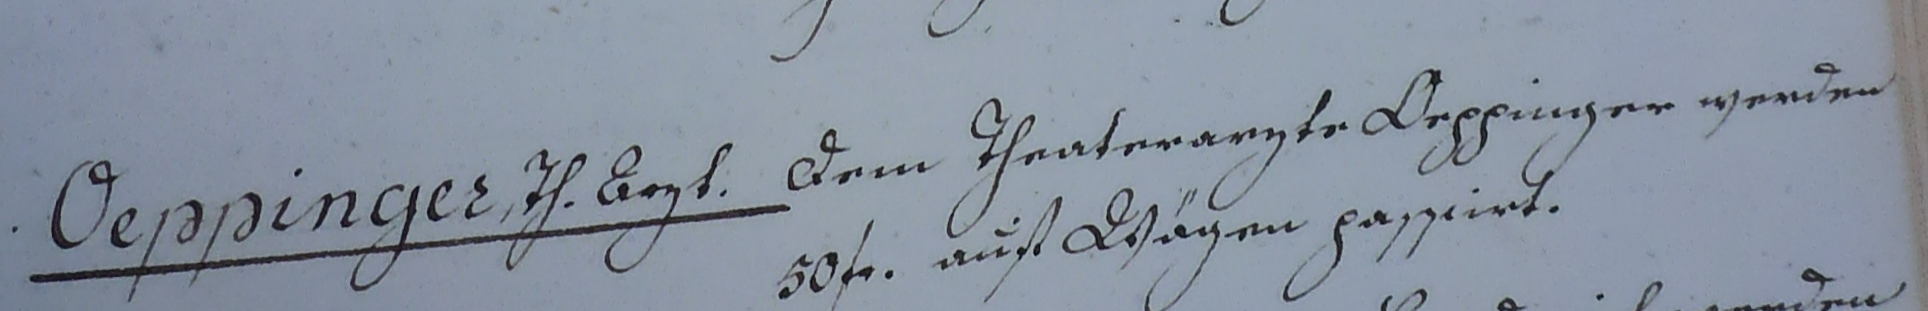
Oeppinger, Th. Arzt. Dem Theaterarzte Oeppinger werden
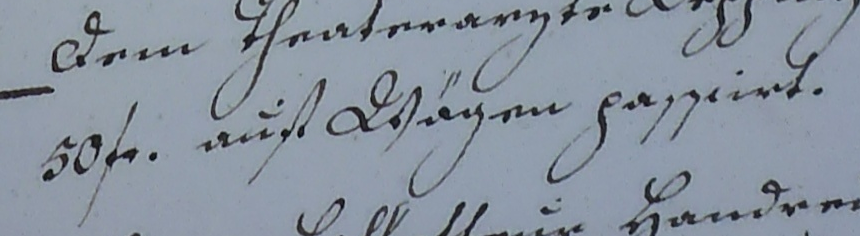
50fr. auf Wägen passirt.
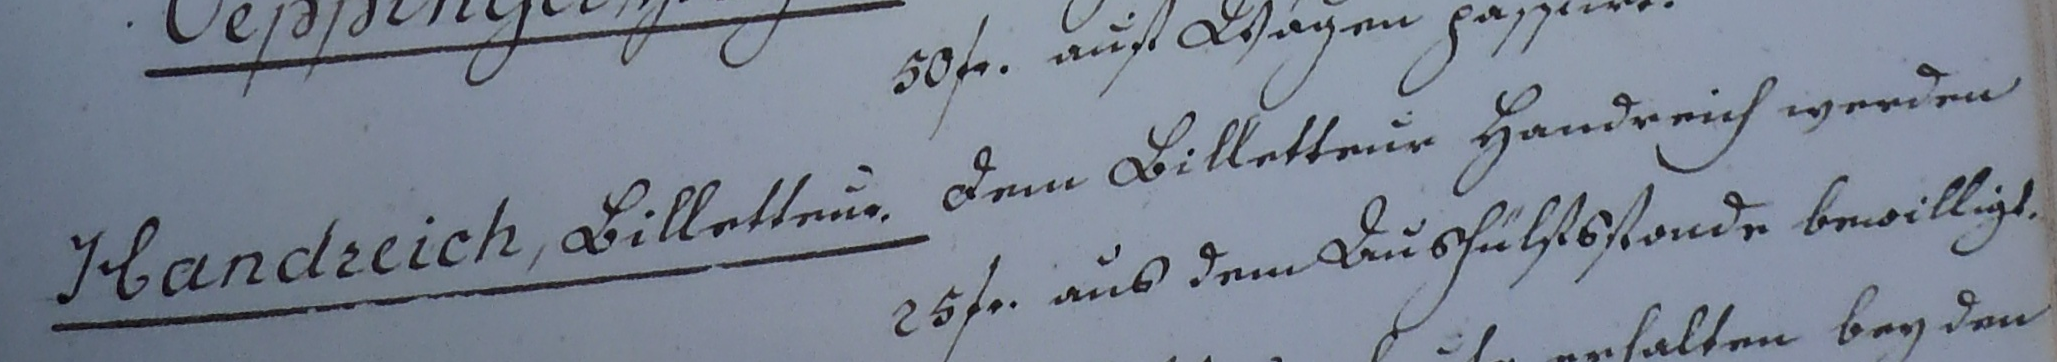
Handreich, Billetteur. Dem Billetteur Handreich werden
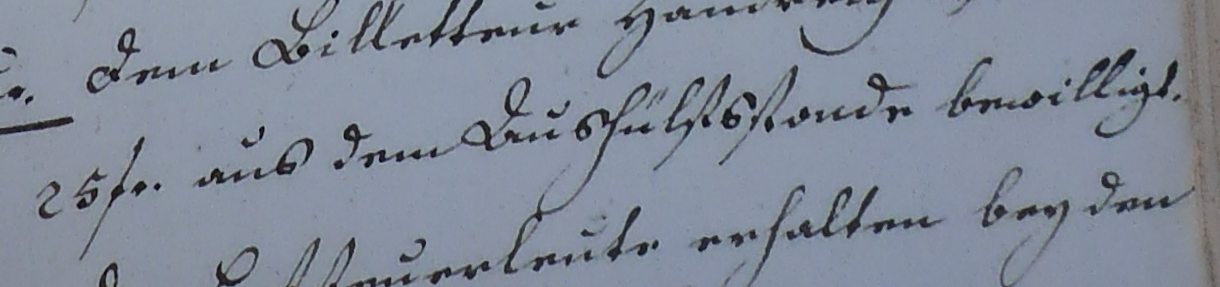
25fr. aus dem Aushülfsfonde bewilligt.
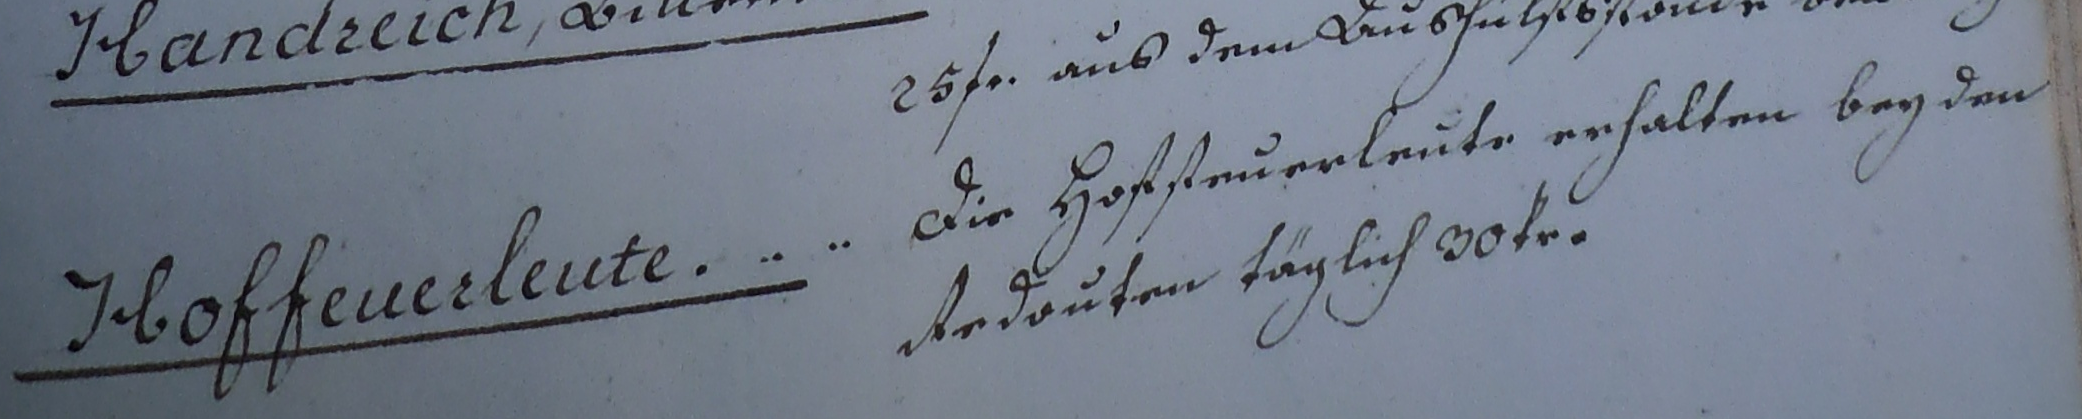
Hoffeuerleute . .. .. Die Hoffeuerleute erhalten bey den
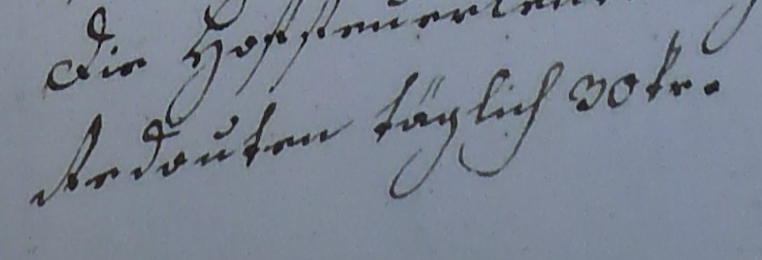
Redouten täglich 30kr.
